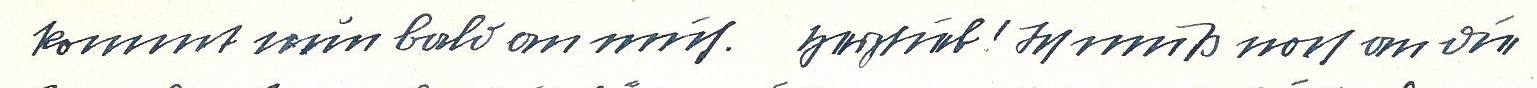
kommt nun bald an mich. Herzlieb! Ich muß noch an die
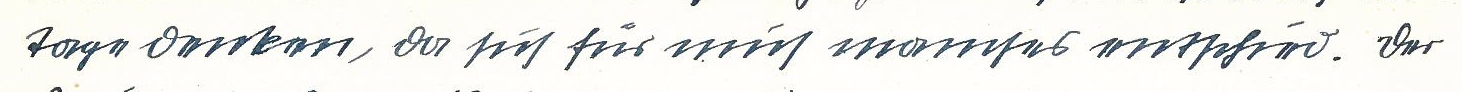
Tage denken, da sich für mich manches entschied! Der
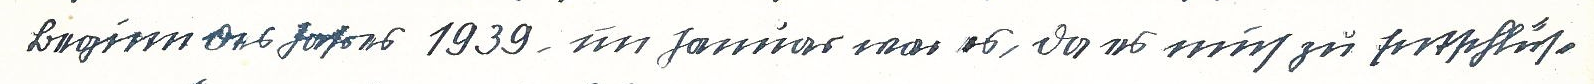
Beginn des Jahres 1939, im Januar war es, da es mich zu Entschlüs¬
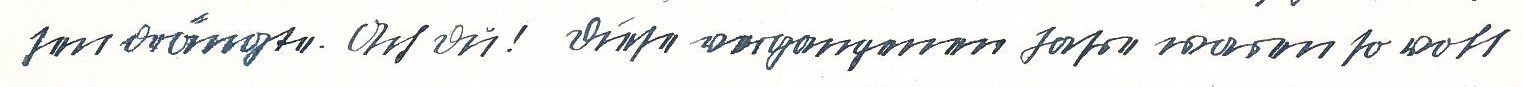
sen drängte. Ach Du! Diese vergangenen Jahre waren so voll
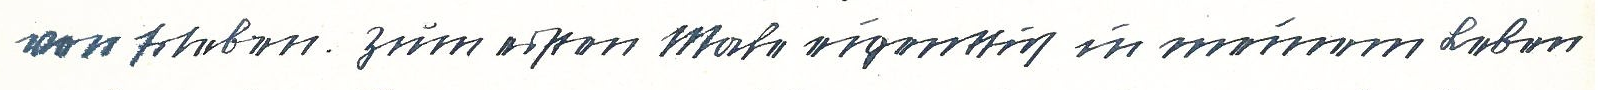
von Erleben. Zum ersten Male eigentlich in meinem Leben
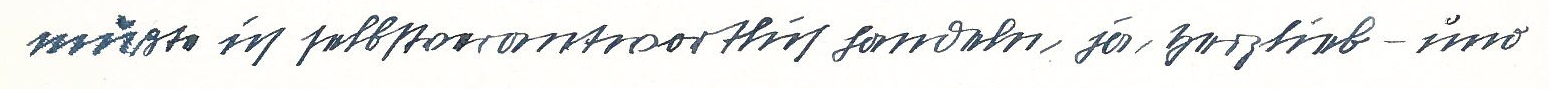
mußte ich selbstverantwortlich handeln, ja Herzlieb – und
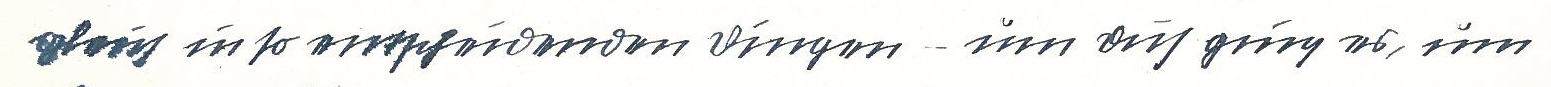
gleich in so entscheidenden Dingen – um Dich ging es, um
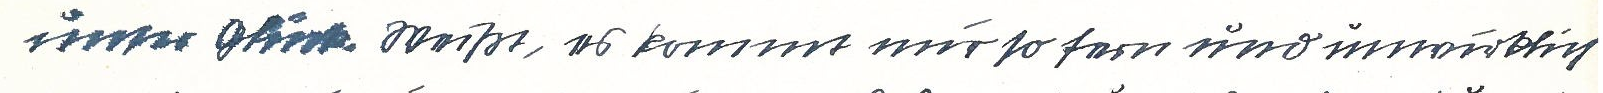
unser Glück. Weißt, es kommt mir so fern und unwirklich
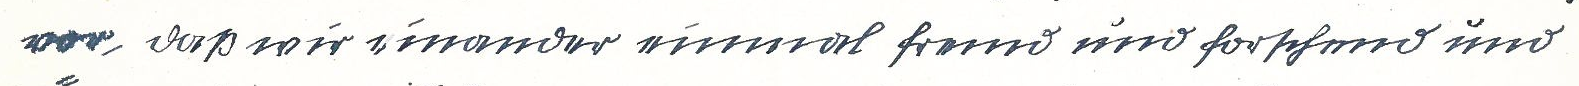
vor, daß wir einander einmal fremd und forschend und
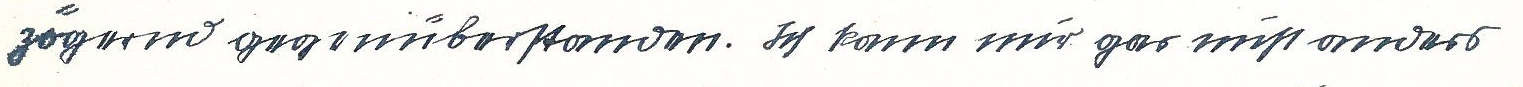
zögernd gegenüberstanden. Ich kann mir gar nicht anders
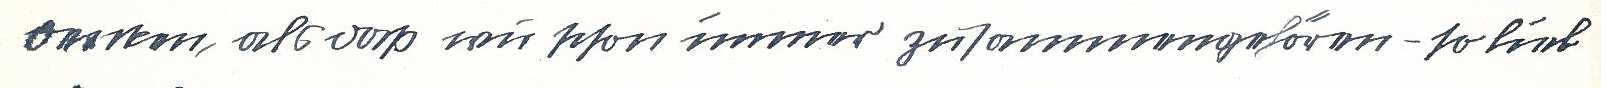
denken, als daß wir schon immer zusammengehören – so lieb
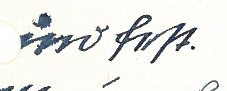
und fest.
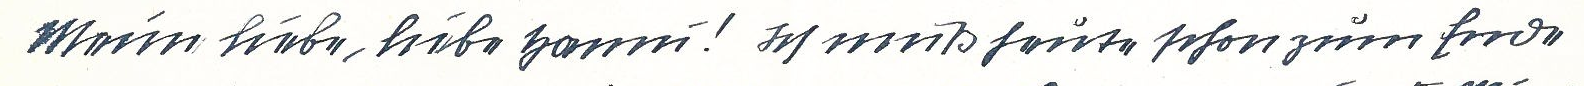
Meine liebe, liebe ! Ich muß heute schon zum Ende
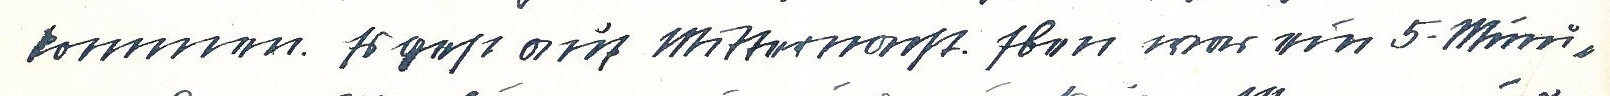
kommen. Es geht auf Mitternacht. Eben war ein 5 – Minu¬
